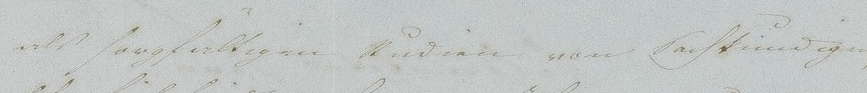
als sorgfältigen Studien von Sachkundigen,
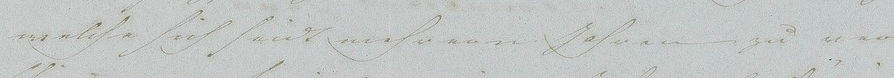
welche sich seidt mehrern Jahren zu ver-
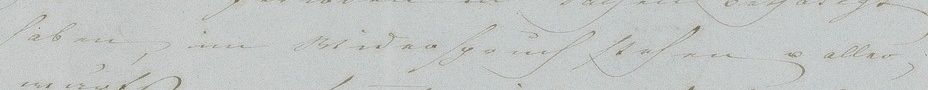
haben, im Widerspruch stehen & aller-
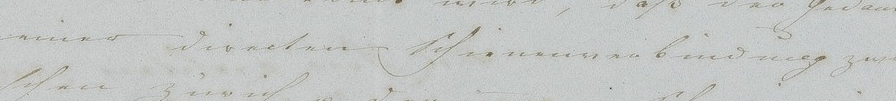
einer directen Schienenverbindung zwi-
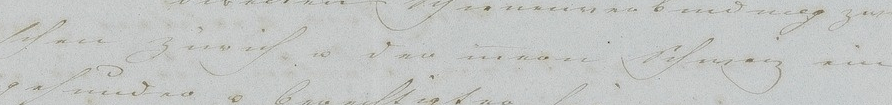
schen Zürich & der innern Schweiz ein
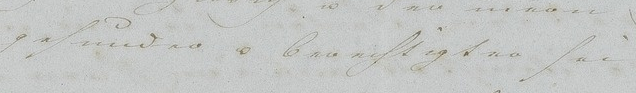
gesunder & berechtigter sei.
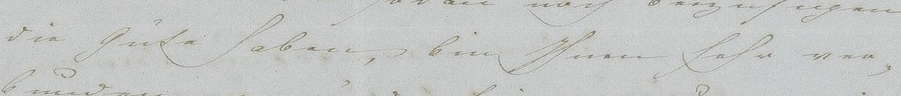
die Güte haben, bin Ihnen sehr ver-
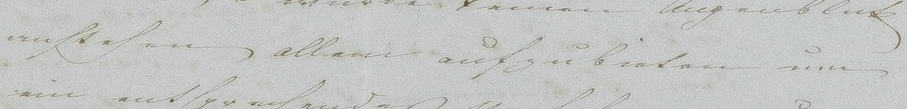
anstehen allem aufzubieten um
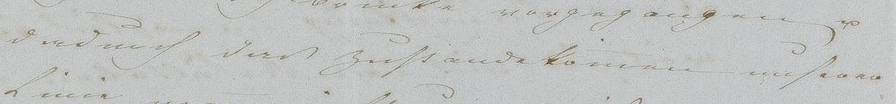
dadurch das Zustandekommen unserer
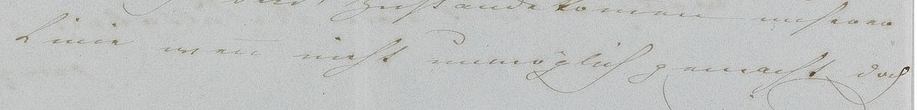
Linie wenn nicht unmöglich gemacht doch
